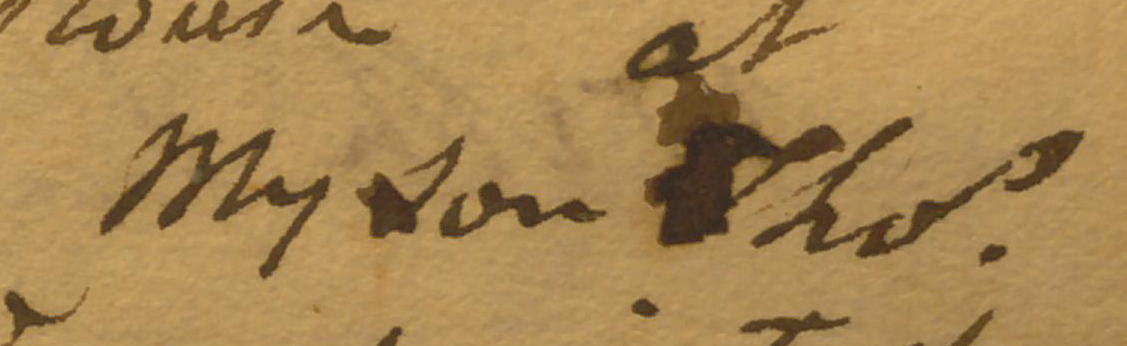My son Tho^s.
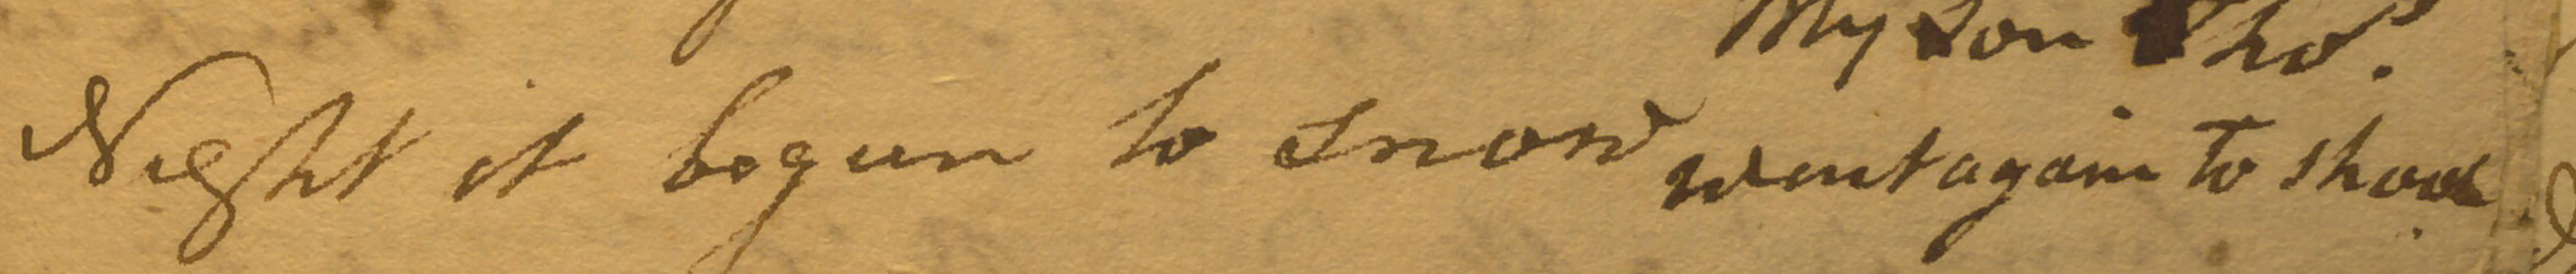Night it begun to snow went again to shool
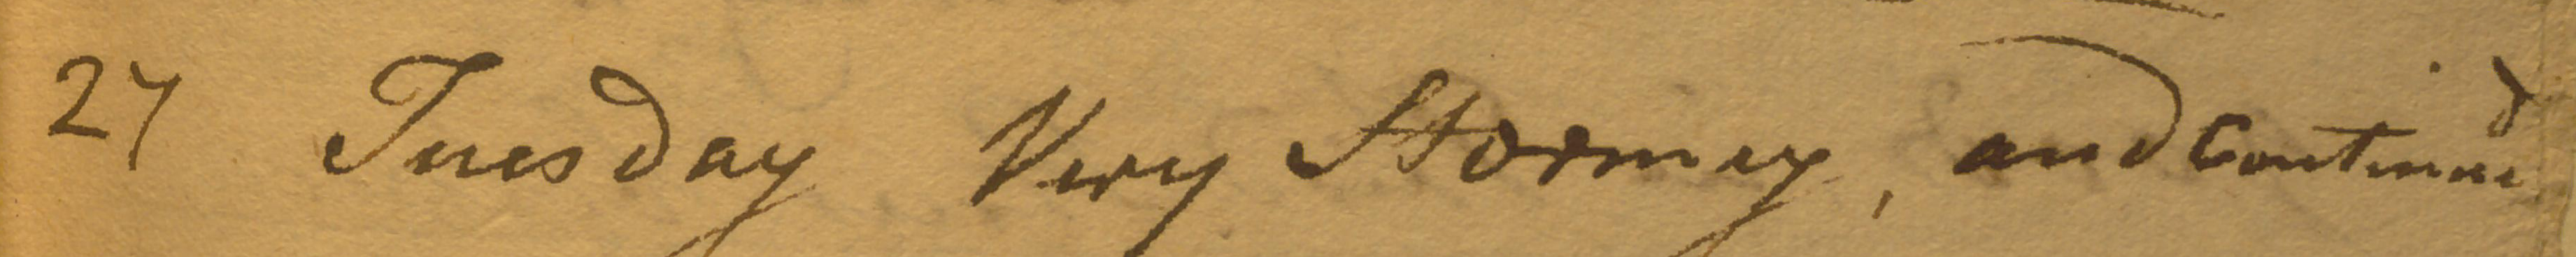27 Tuesday Very Stormey, and Continu^d
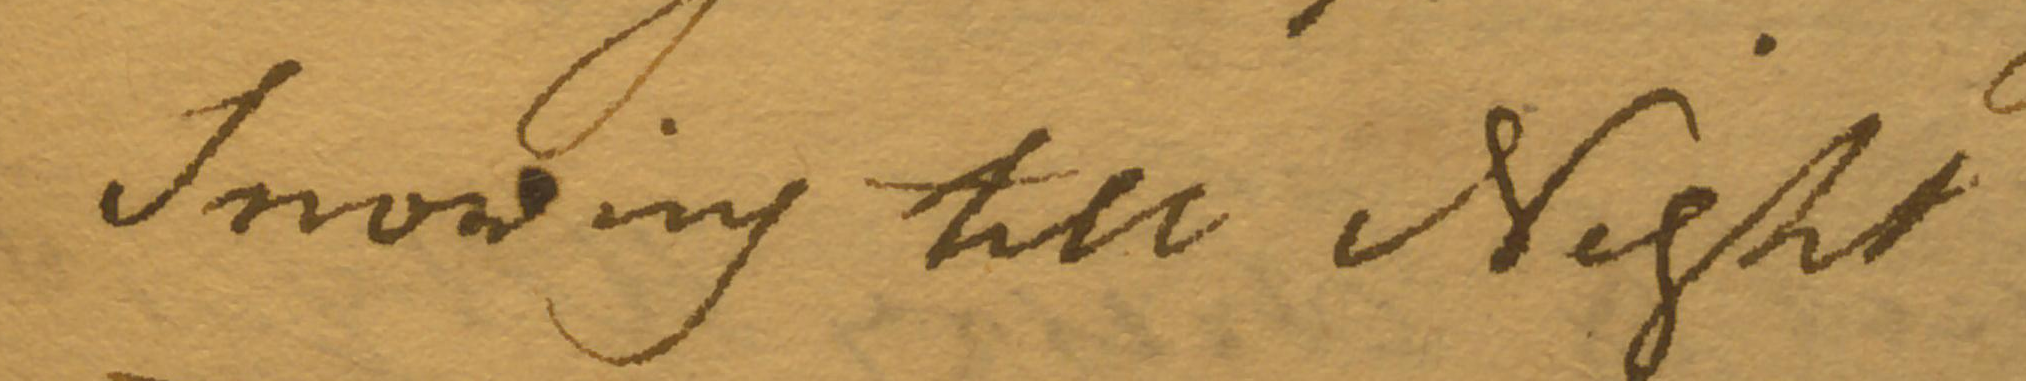snowing till Night
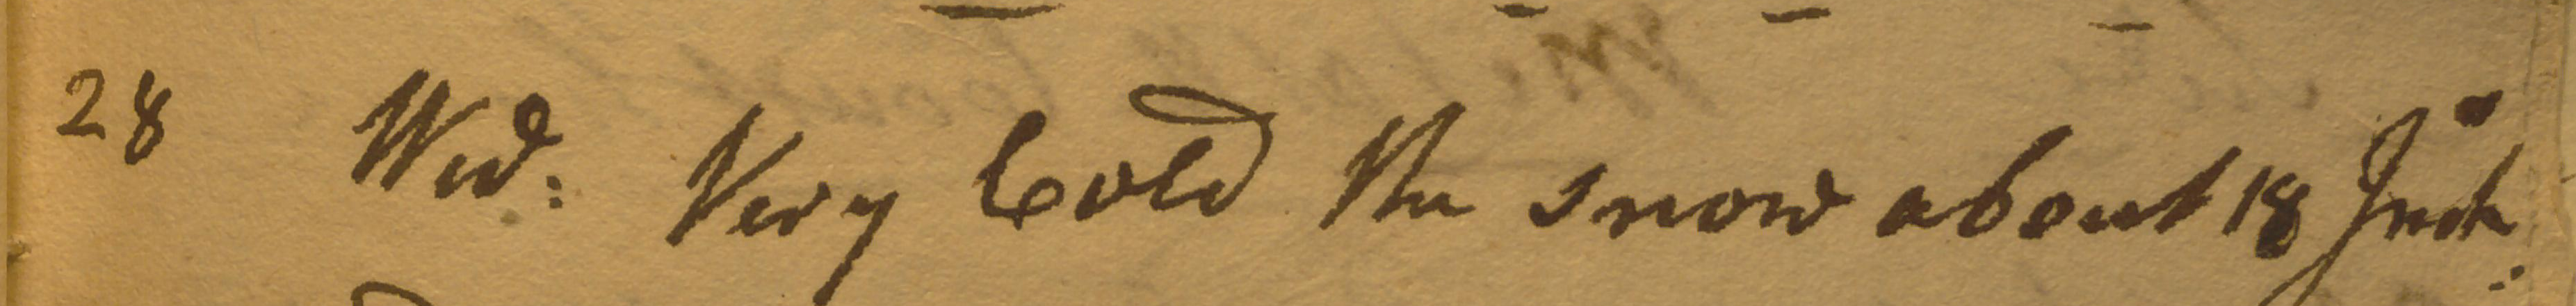28 Wed. Very Cold the snow about 18 Inch
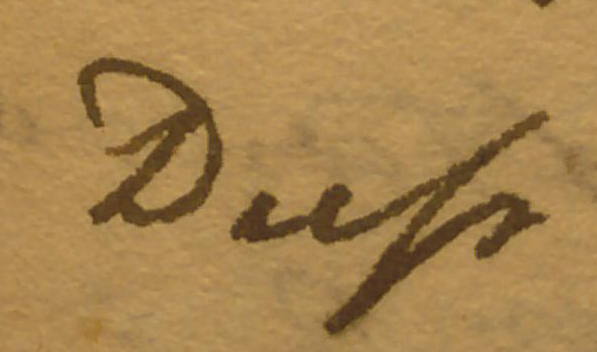Deep
